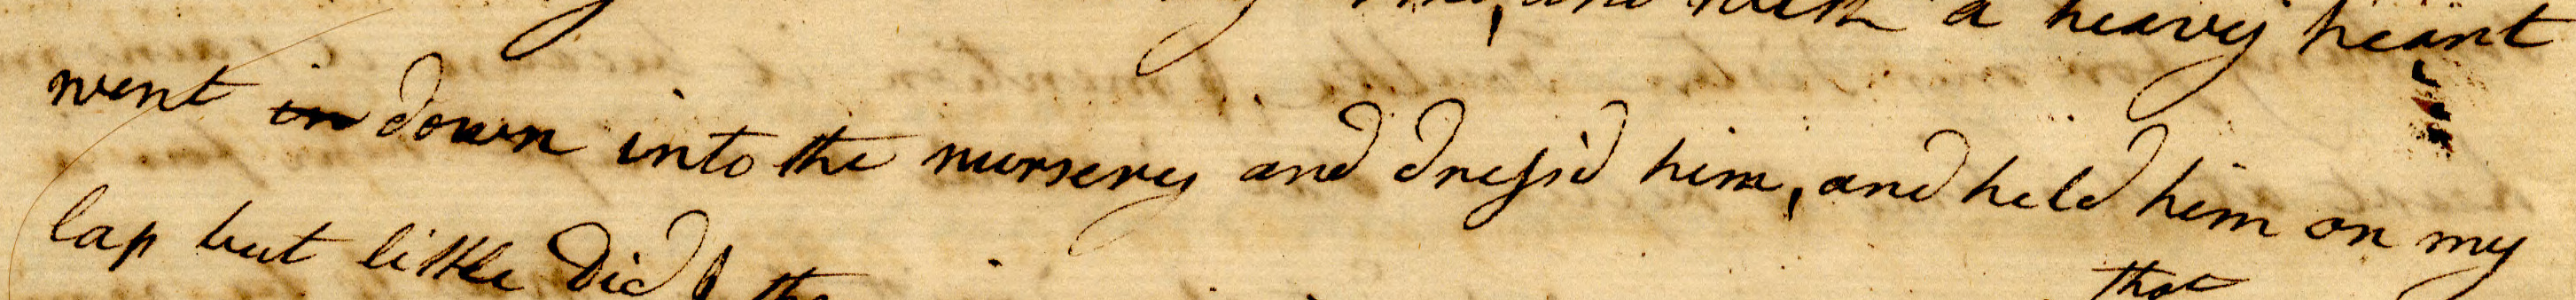went down into the nursery and dress'd him, and held him on my
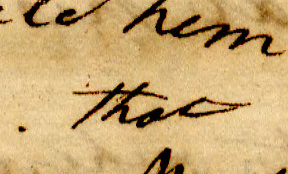that
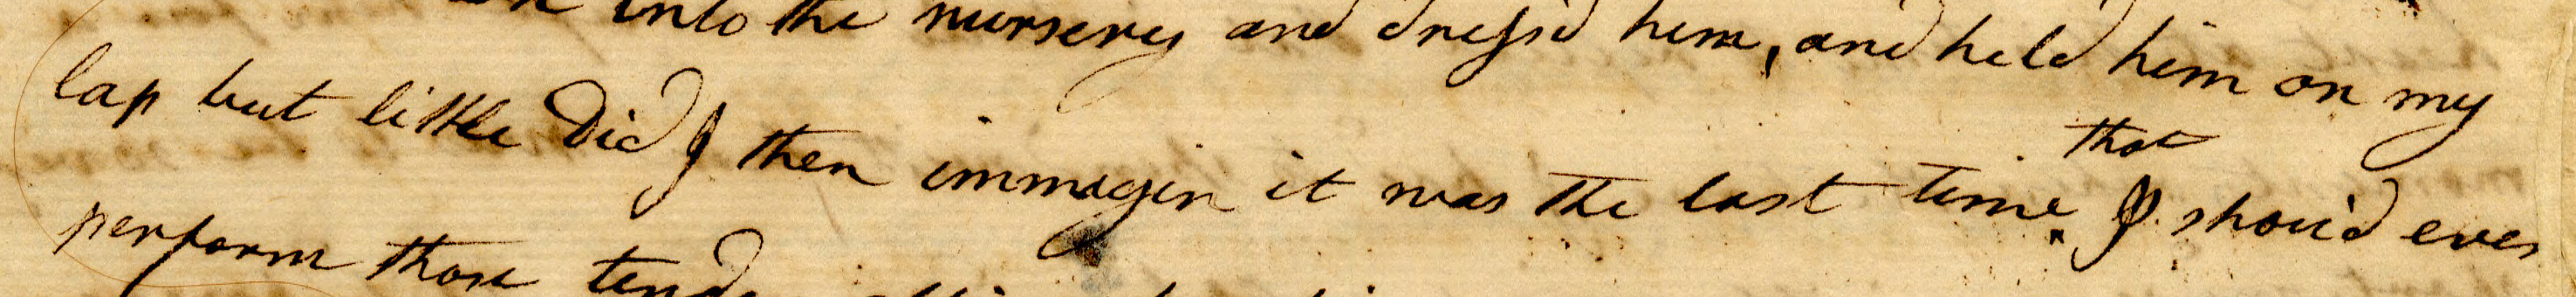lap but little did I then immagin it was the last time ^ I shou'd ever
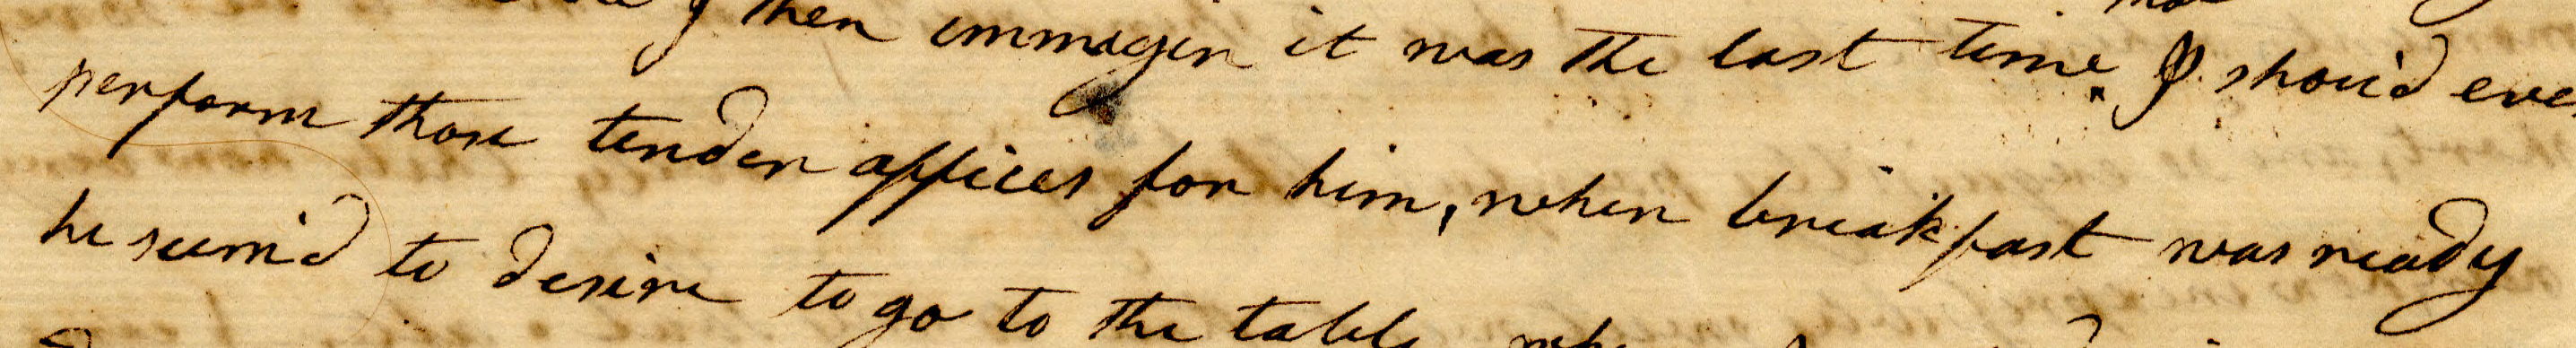perform those tender offices for him, when breakfast was ready
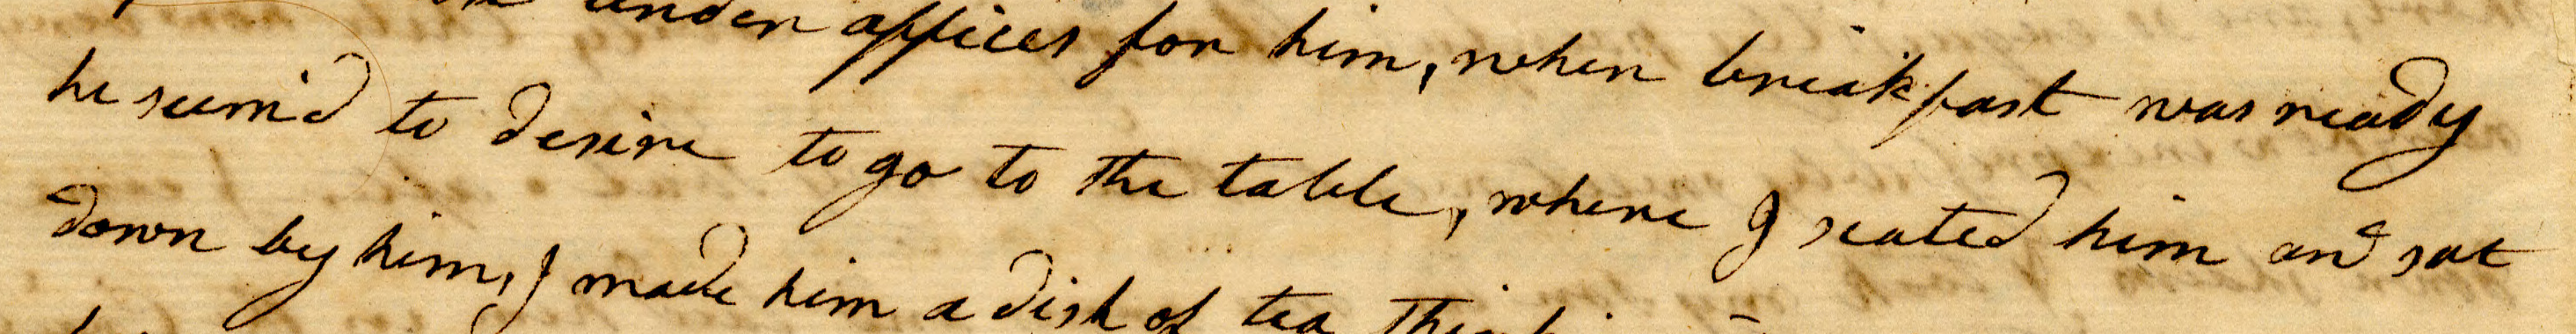he seem'd to desire to go to the table, where I seated him and sat
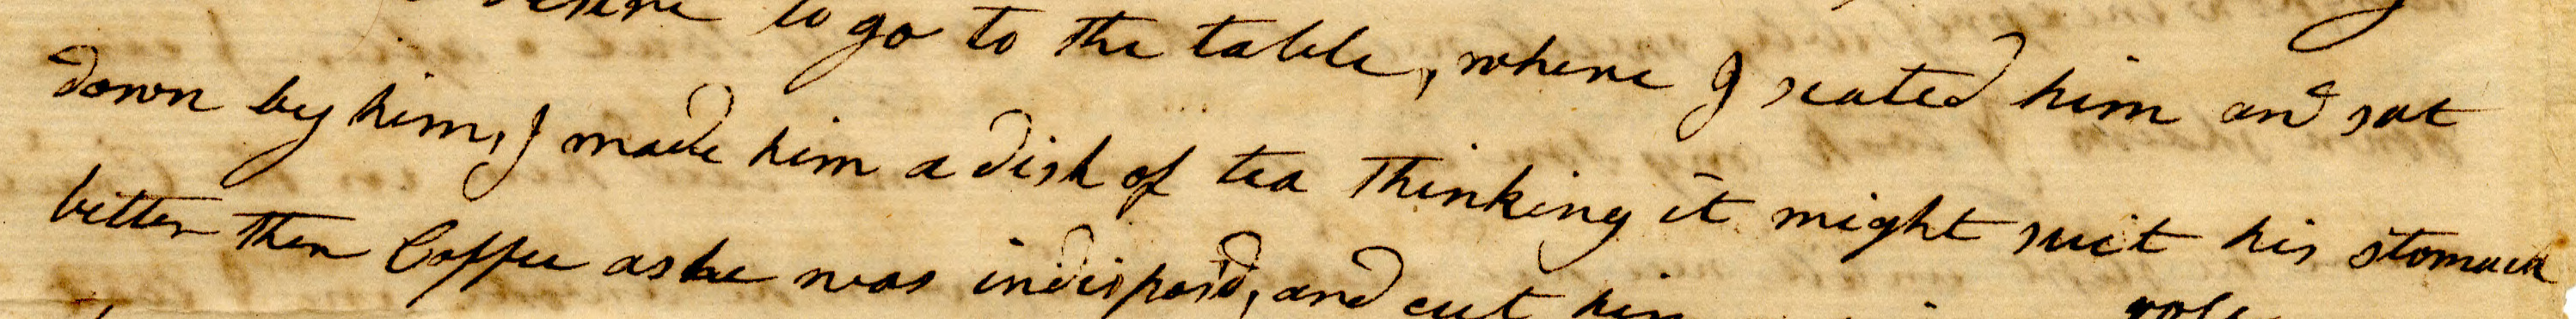down by him, I made him a dish of tea thinking it might suit his stomach
